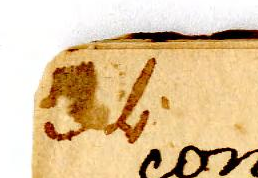34
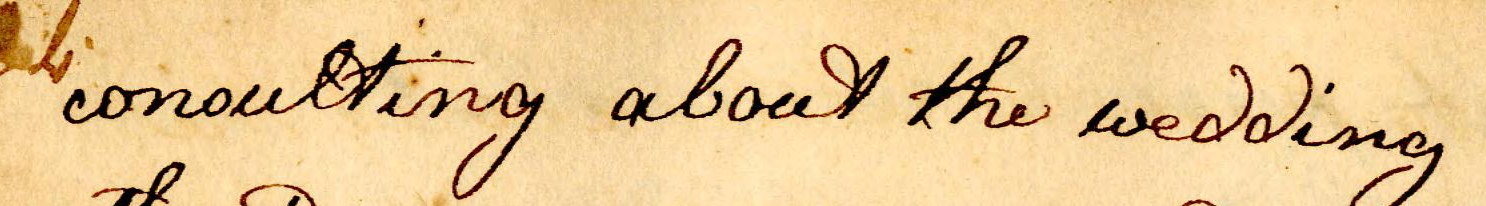consulting about the wedding
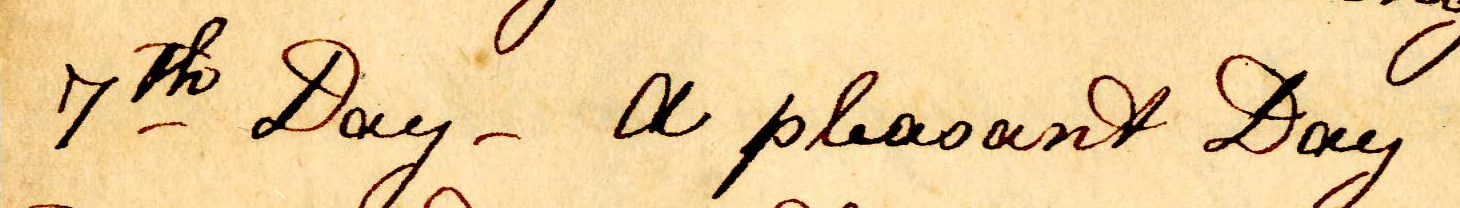7^th Day- A pleasant Day
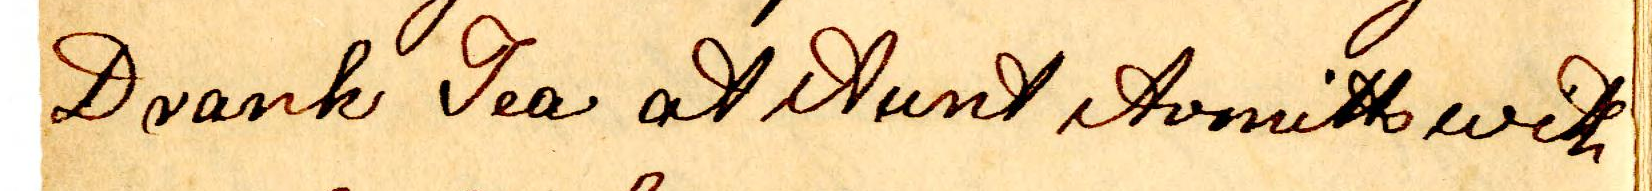Drank Tea at Aunt Armitts with
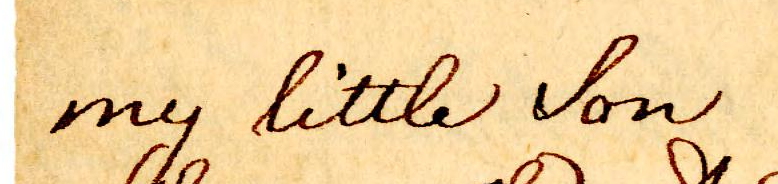my little Son
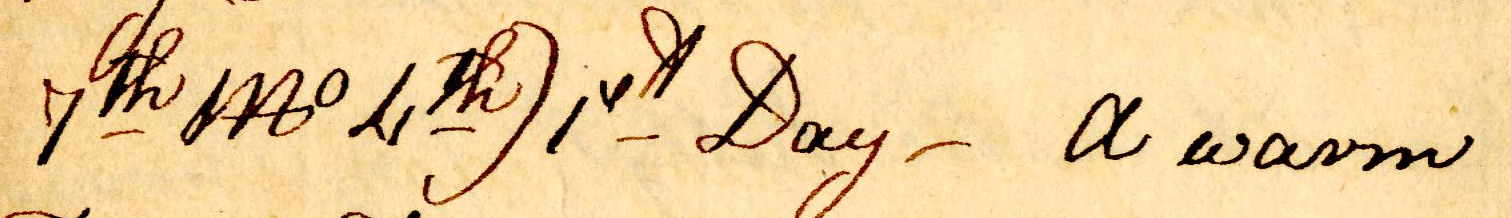7^th M^o 4^th) 1^st Day- A warm
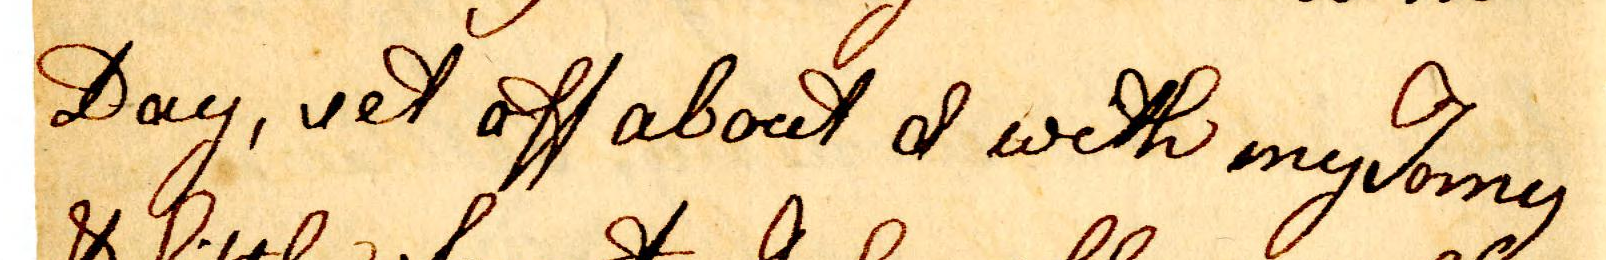Day, set off about 8 with my Tomy
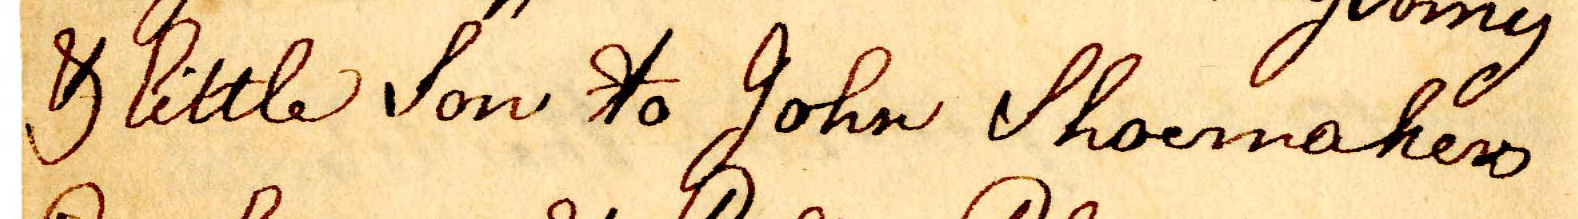& little Son to John Shoemakers
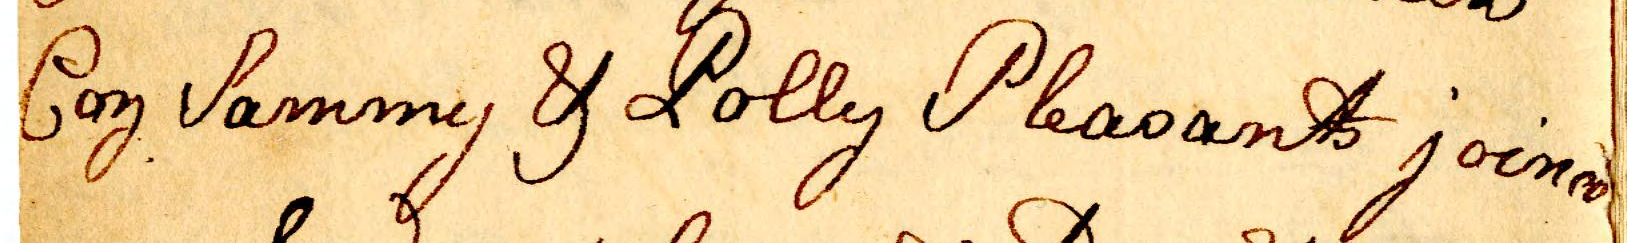Coz Sammy & Polly Pleasants joined
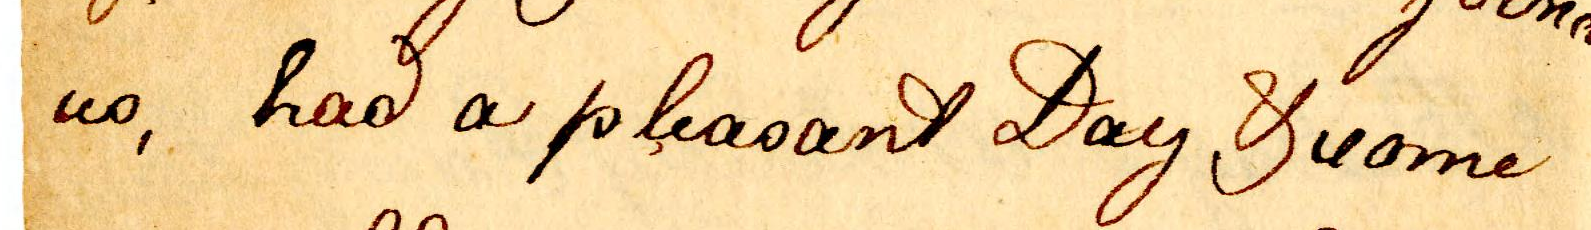us, had a pleasant Day & some
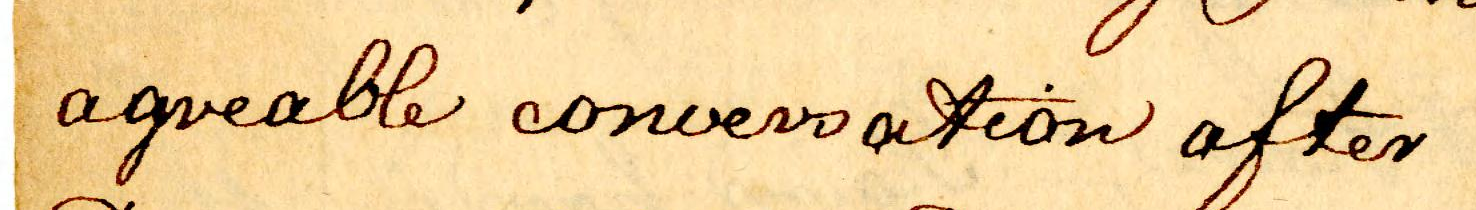agreable conversation after
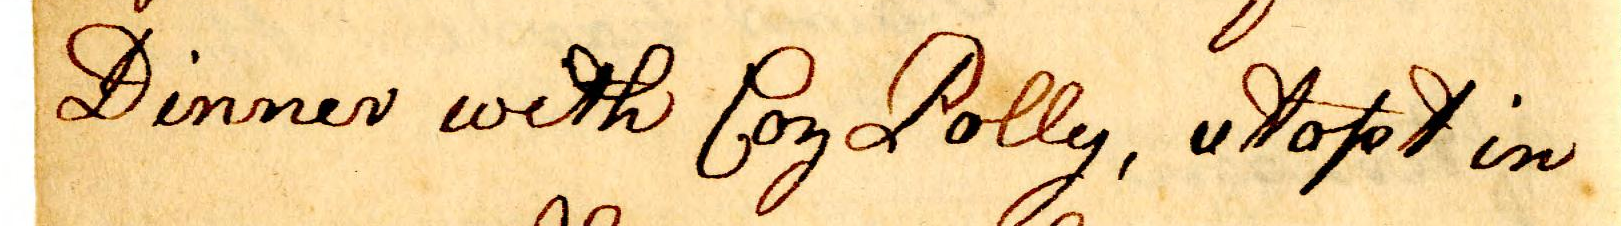Dinner with Coz Polly, stopt in
